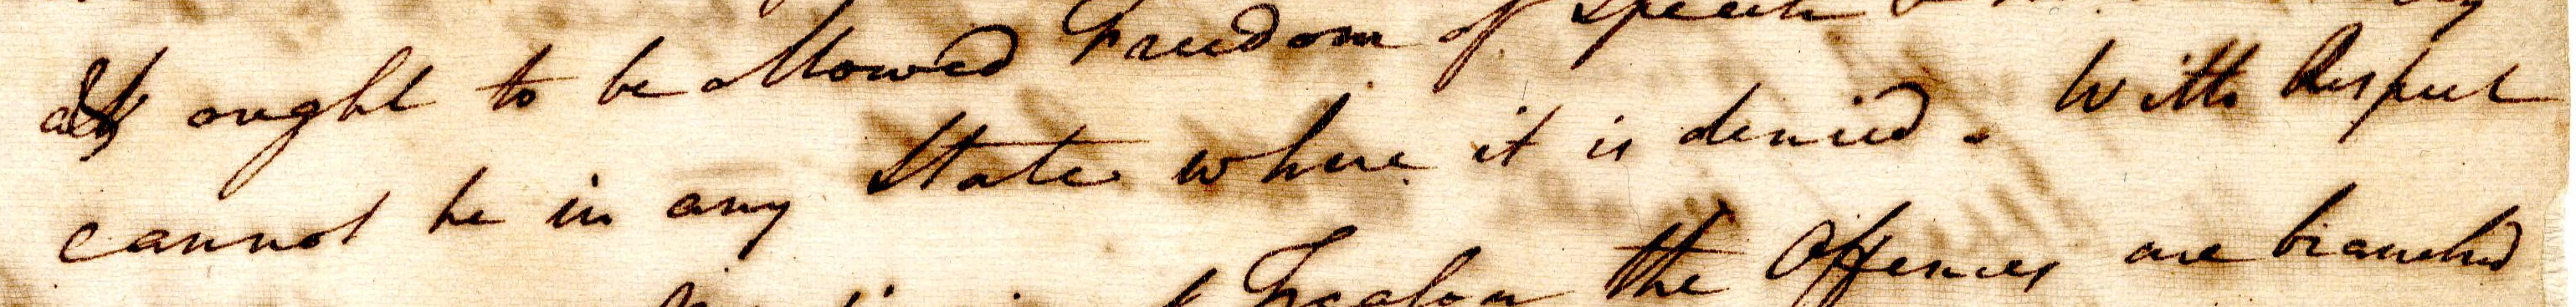cannot be in any State where it is denied. With Aspect
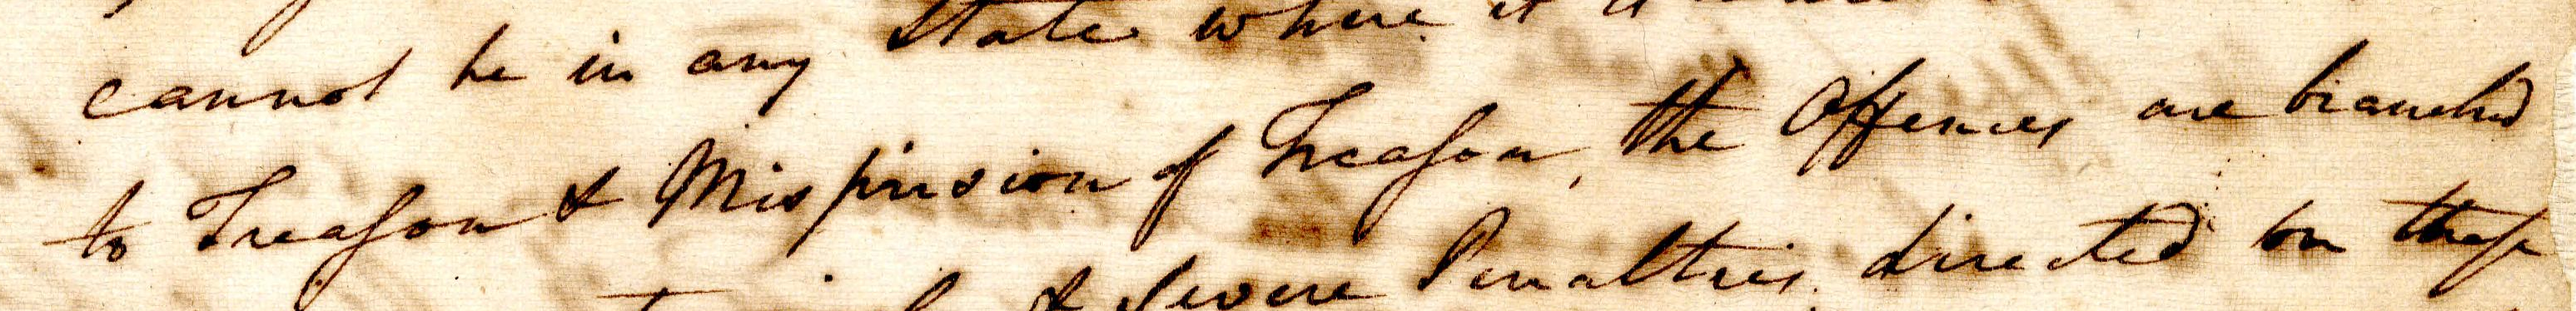to Treason & Misprision of Treason, the Offences are branched
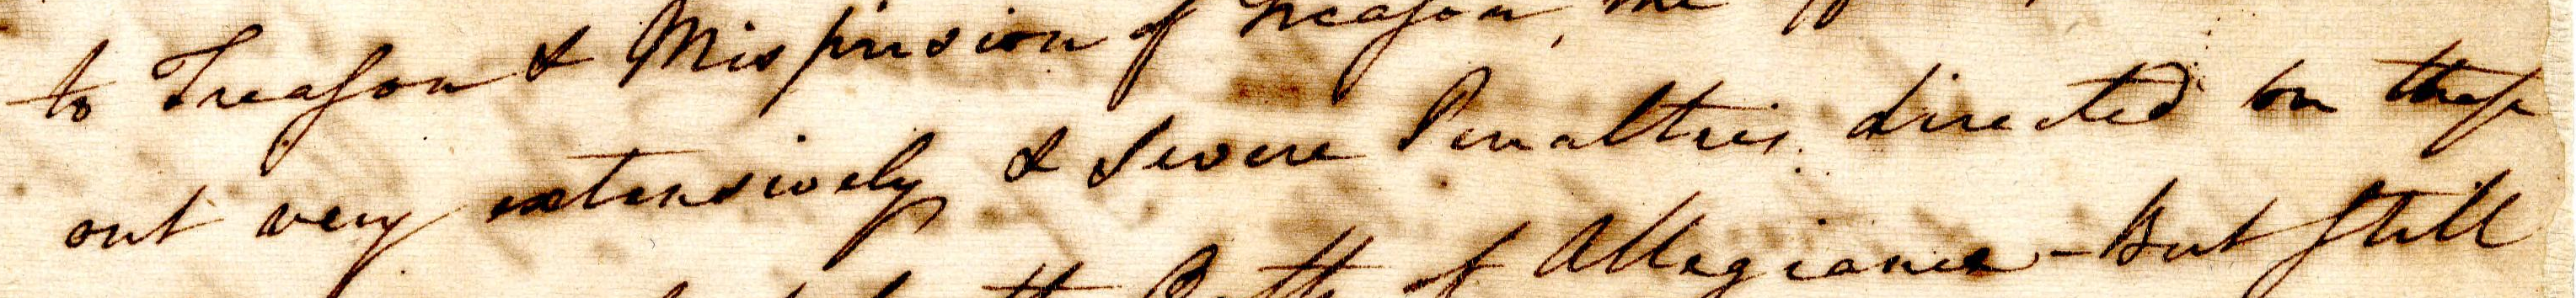out very extensively & severe Penalties, directed on those
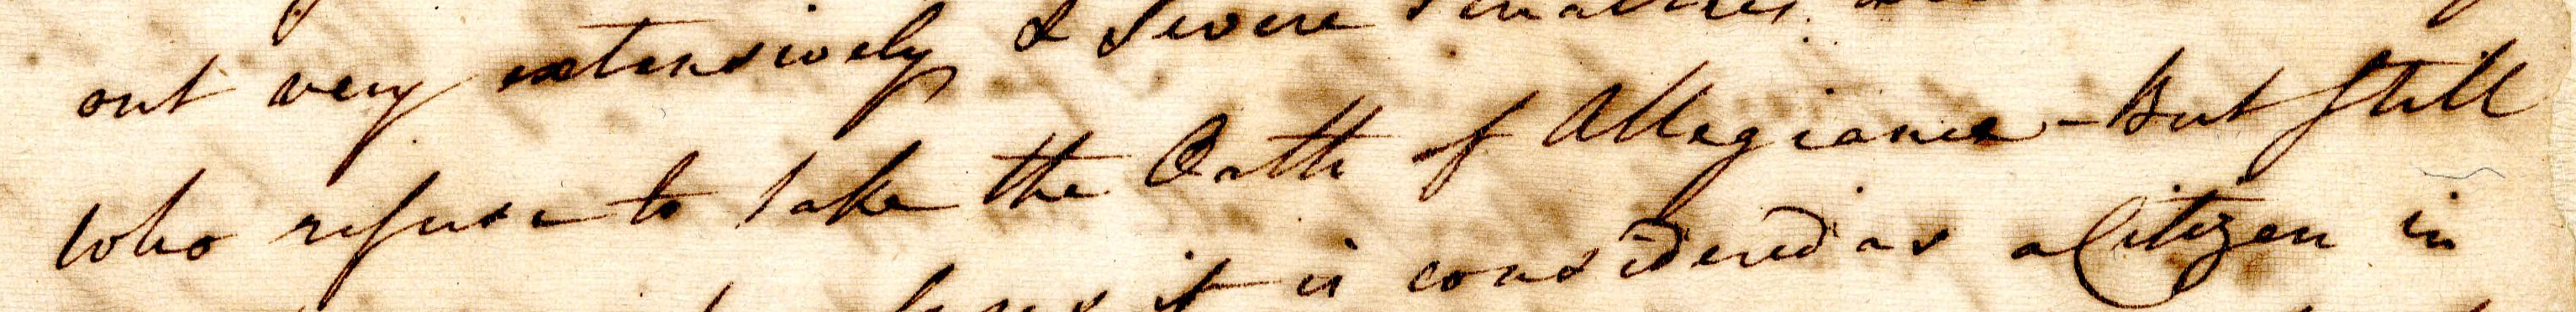who refuse to take the Oath of Allegiance. But still
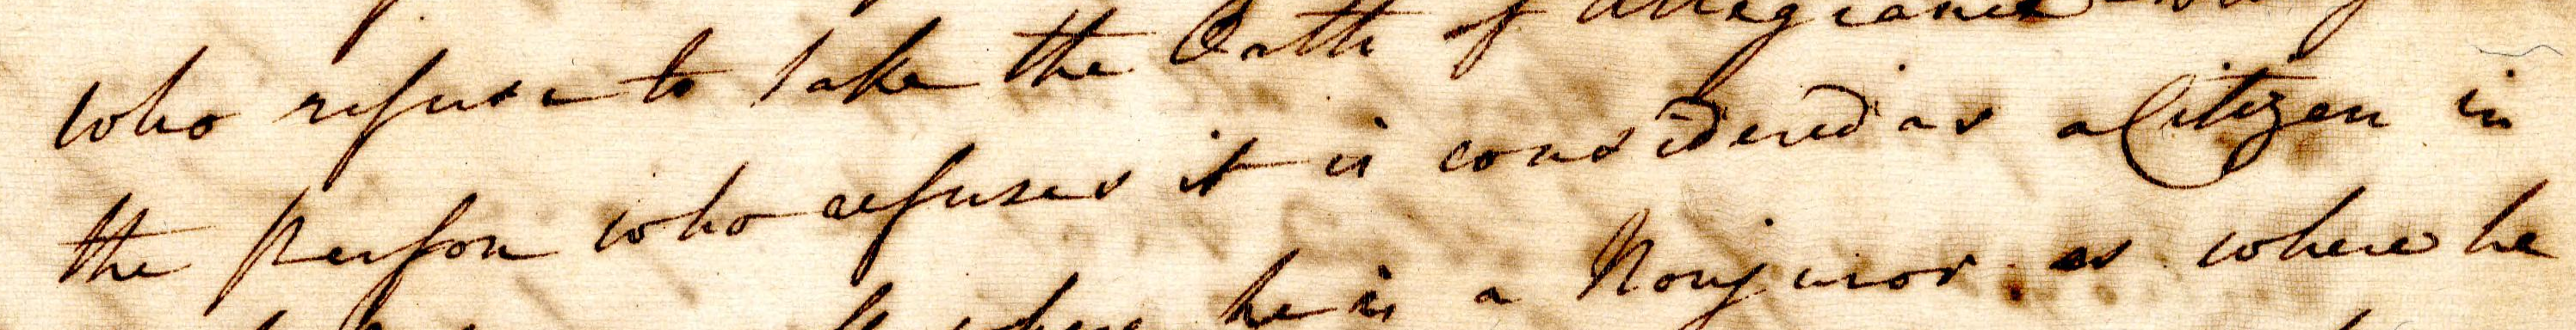the Person who refuses it is considered as a Citizen in
